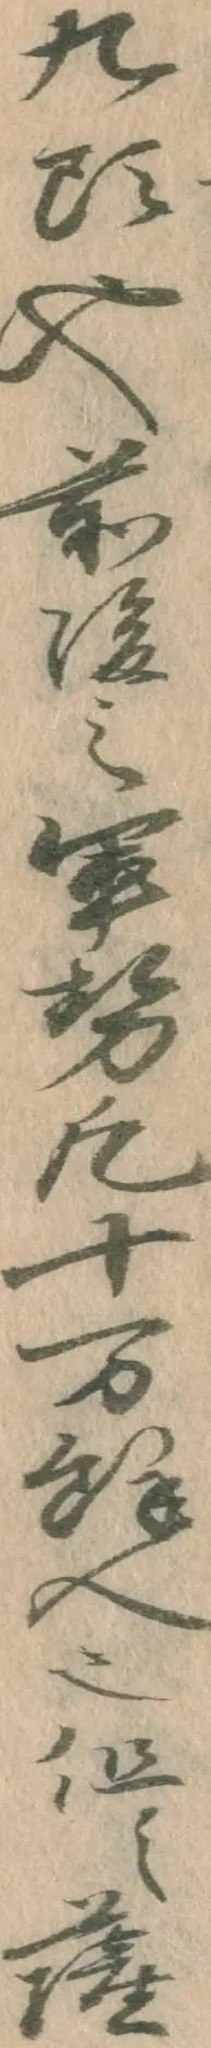九頭也前後之軍勢凡十万余人也但し薩
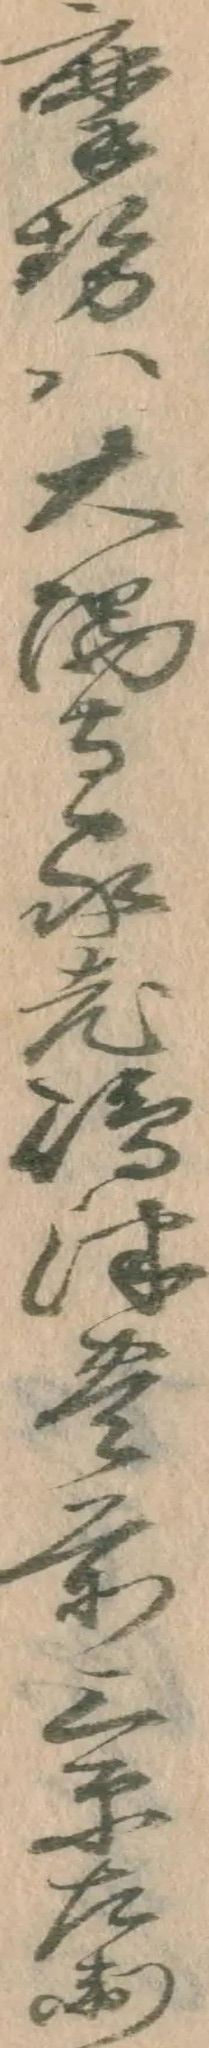摩勢は大隅守家老島津豊前三原左衛
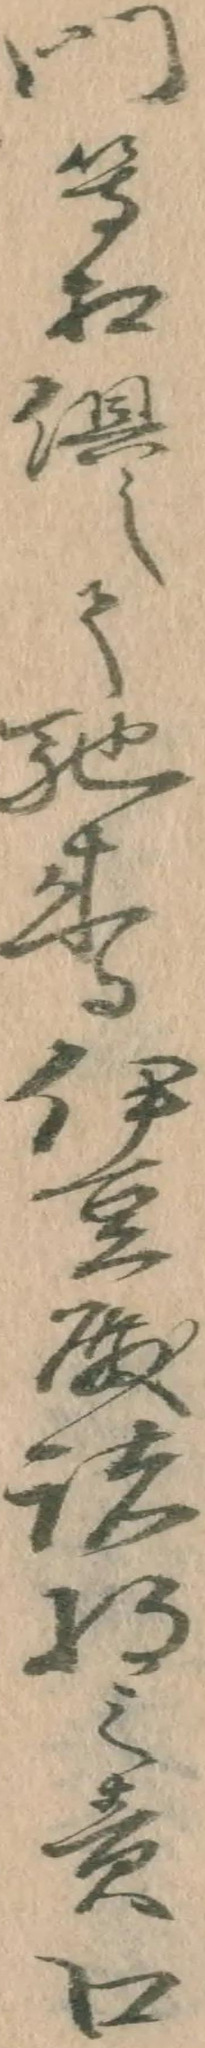門等相俱して馳来る伊豆守殿諸将之責口
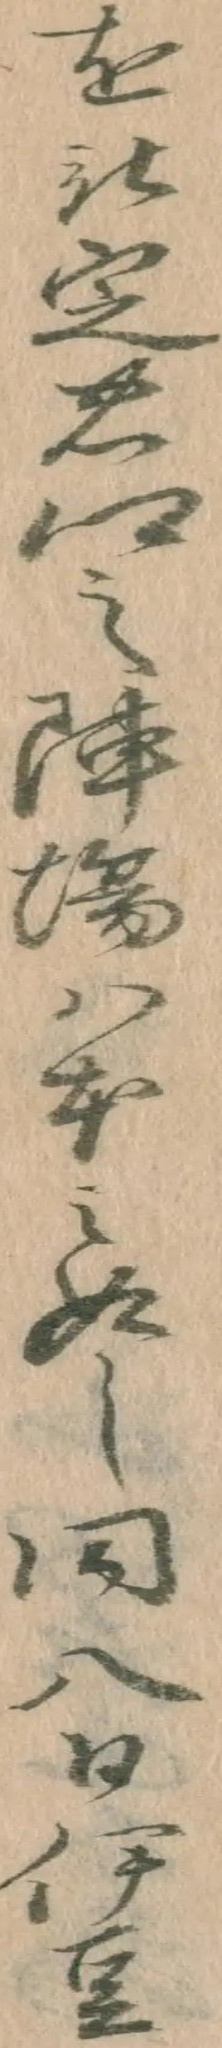を被定忠郷之陣場は本之如し同八日伊豆
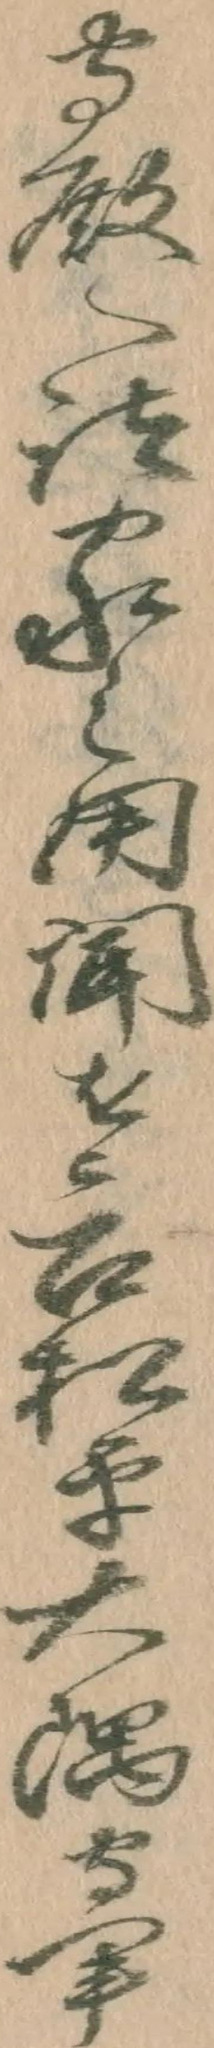守殿へ諸家之用聞を被召松原大隅守軍
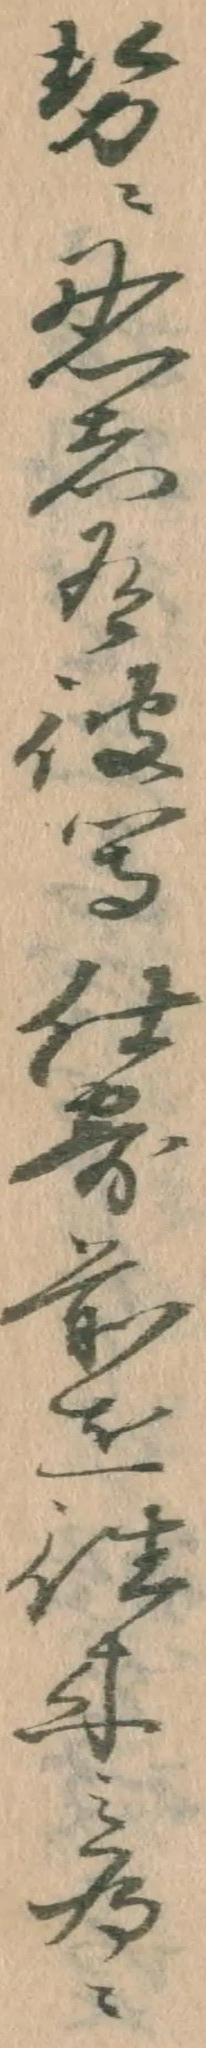勢に忍者有彼等仕寄前を往来之為に
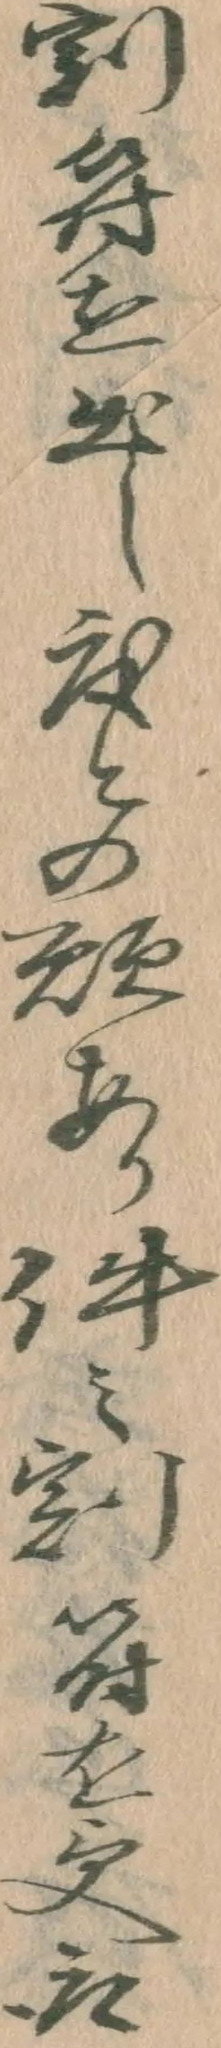割符を出し度との願あり件之割符を受取
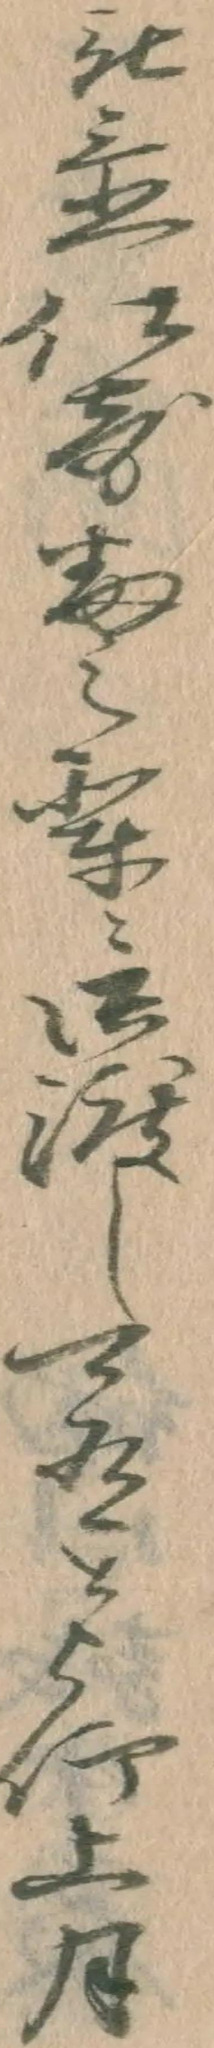被置仕寄番之輩に御渡し可有と被仰上月
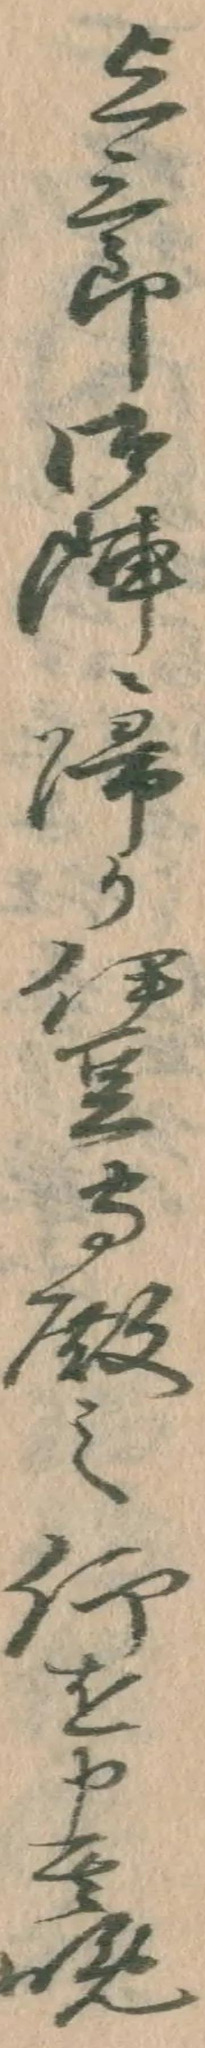与三郎御陣に帰り伊豆守殿之仰を申其晩
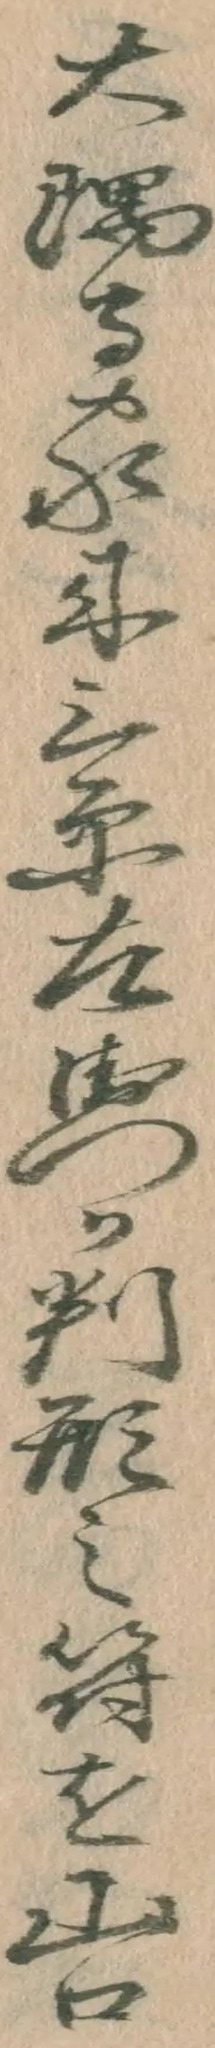大隅守家来三原左衛門か判形之符を山口
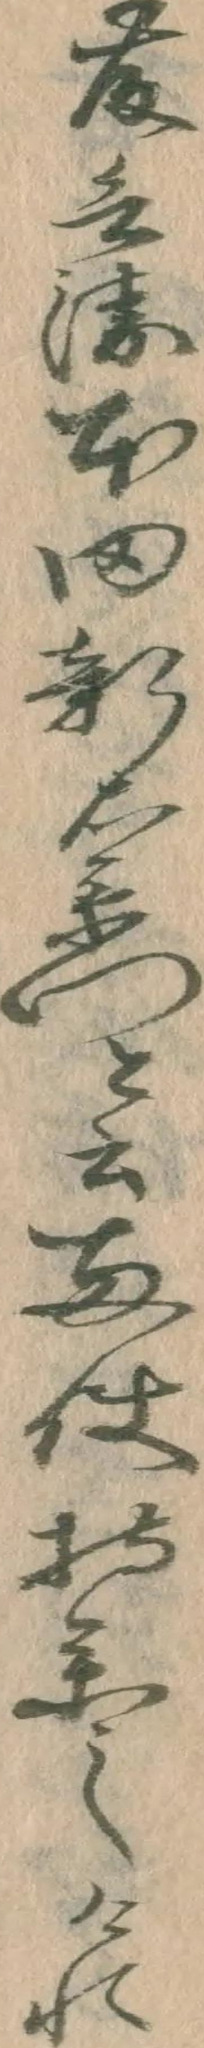藤兵衛本田新右衛門と云両使持参しけれ
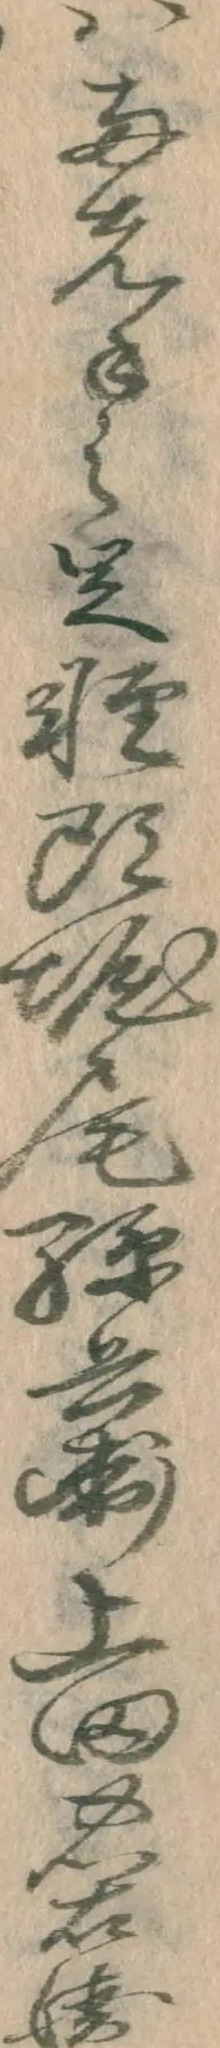は両先手之足軽頭堀尾孫兵衛上田忠右衛
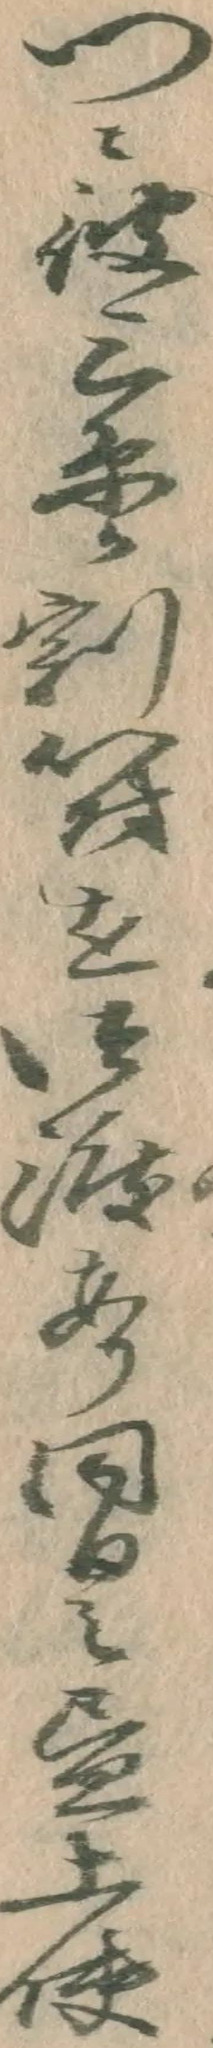門に彼三原か割符を御渡あり同日之昼上使
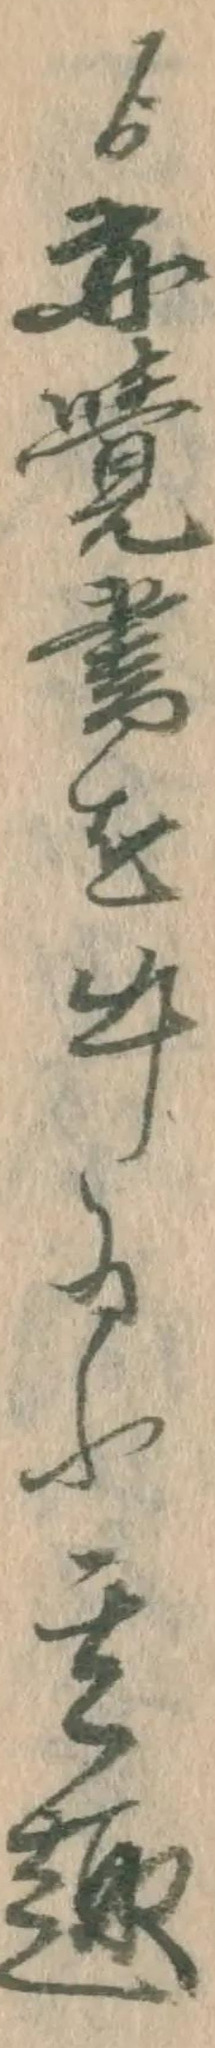ゟ亦覚書を出しゐふ其趣
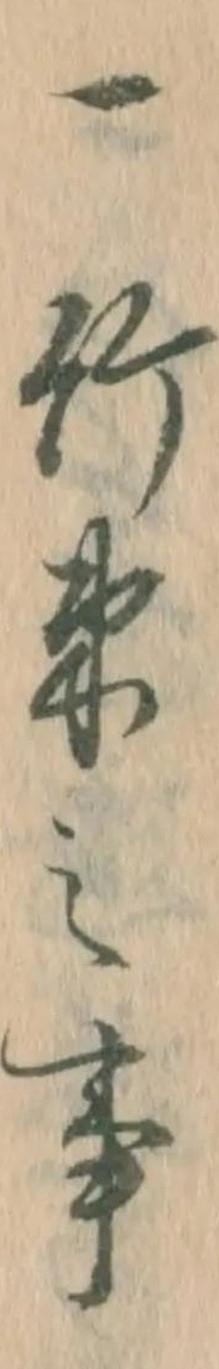一竹束之事

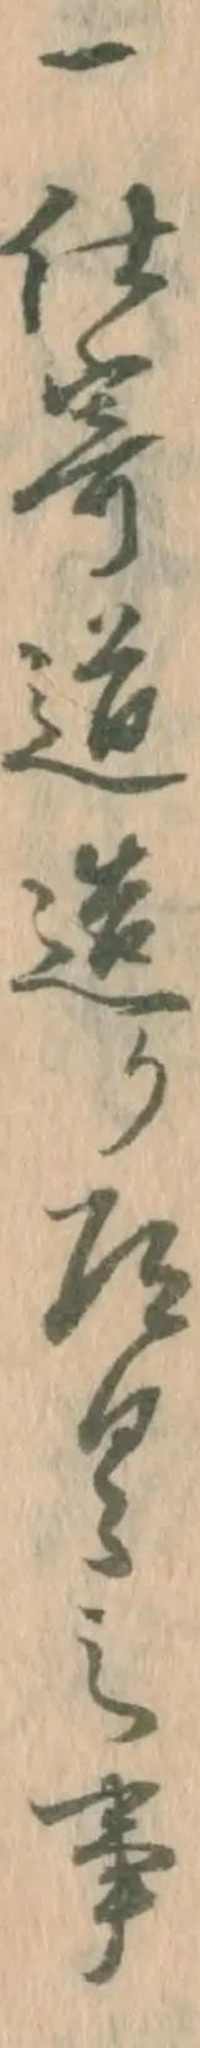一仕寄道造り道具之事
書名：切支丹御退治記 49巻. [5]
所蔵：国立国会図書館 National Diet Library, JAPAN
